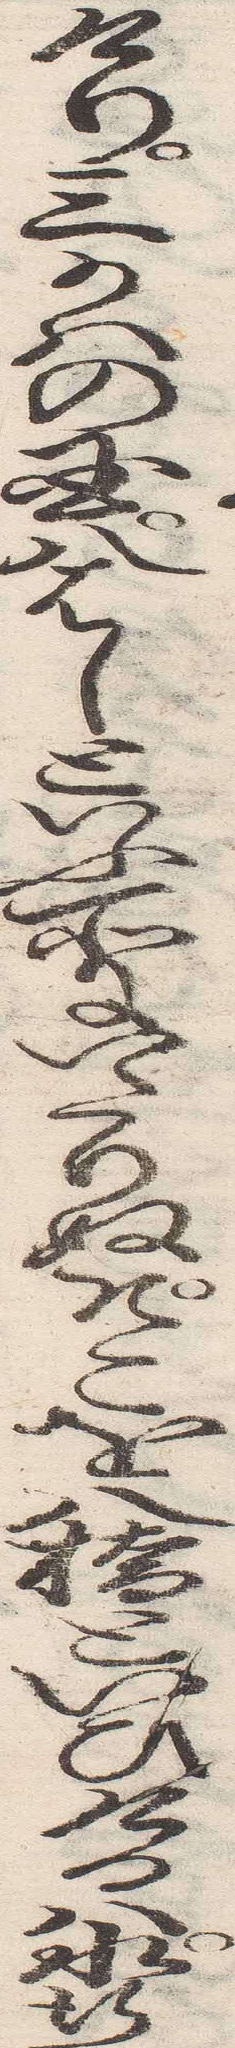けり。三かはの国。八はしといふ所にいたりぬ。そこを八橋といひけるは。水行
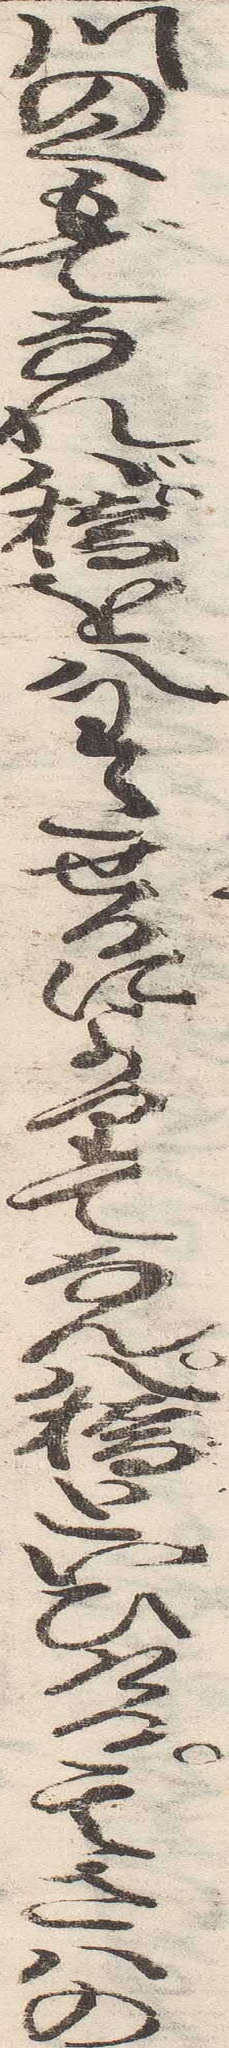川のくもでなれば。橋を八わたせるによりてなん。八橋といひける。其さはの
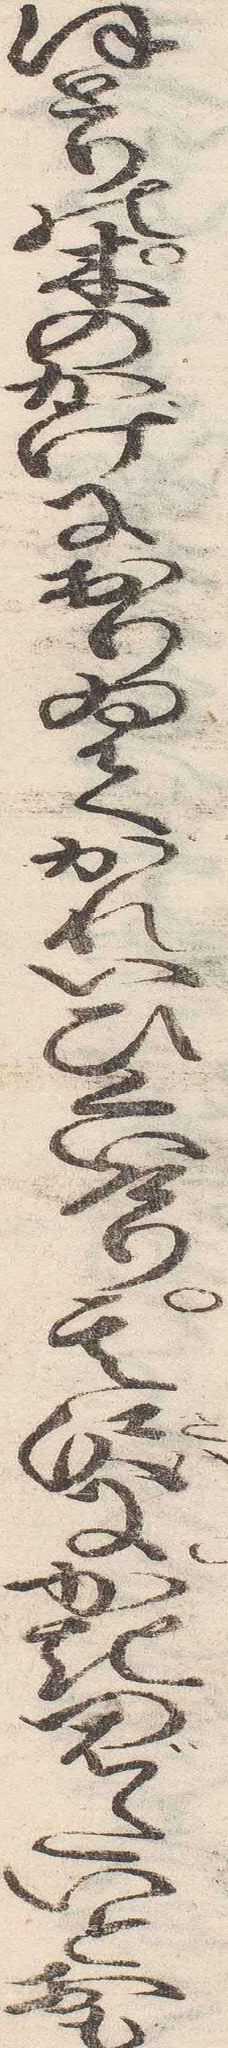ほとりの。木のかげにおりゐてかれいひくいけり。其沢に。かきつばたいとおも

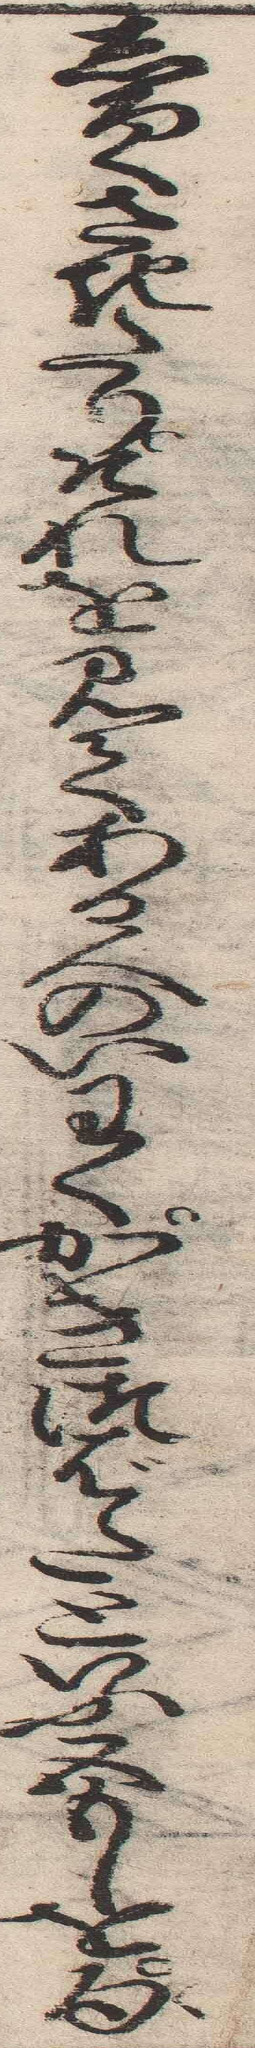しろくさきたり。それを見てある人のいわく。かきつばたといふ五もしを。句
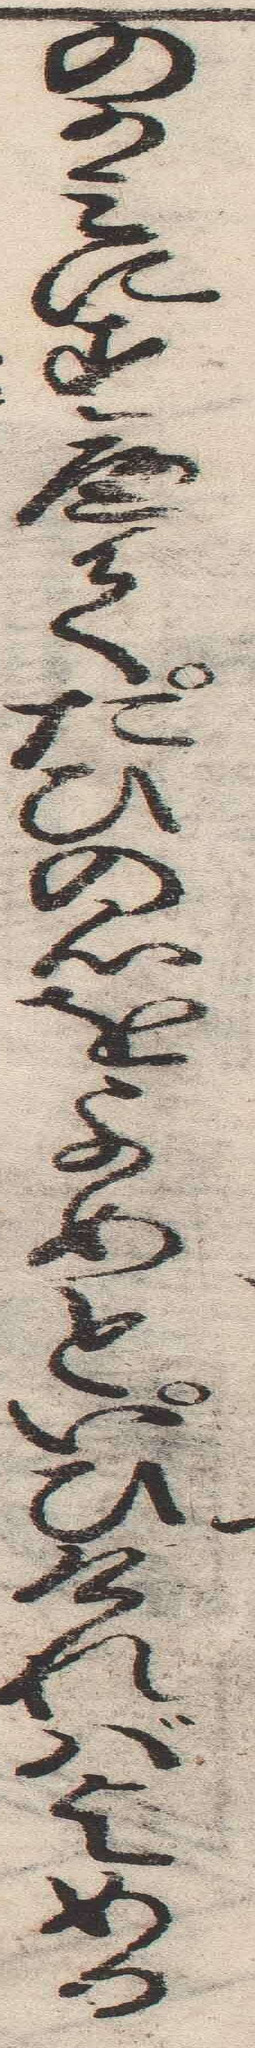のかみにすへて。たひの心をよめと。いひければよめる
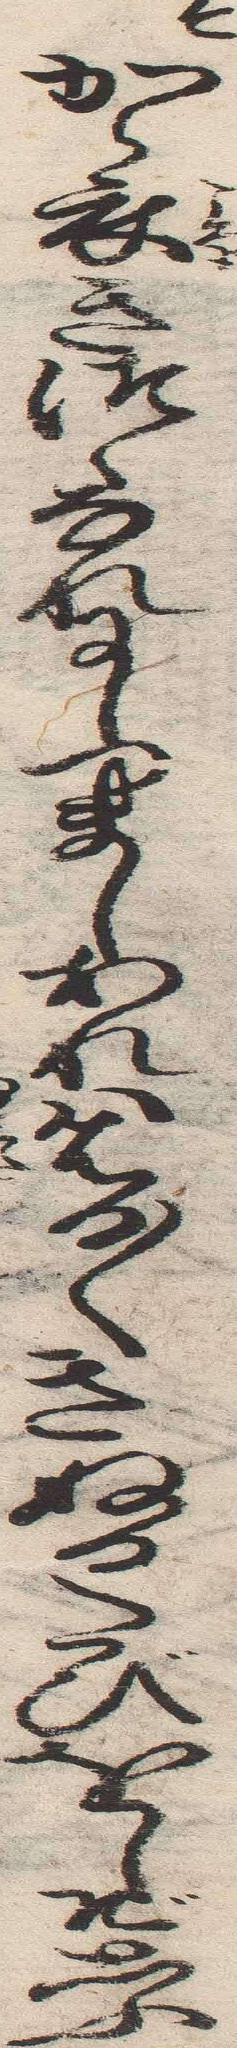古今から衣きつゝなれにしつましあれははる〳〵きぬるたびをしぞ思ふ
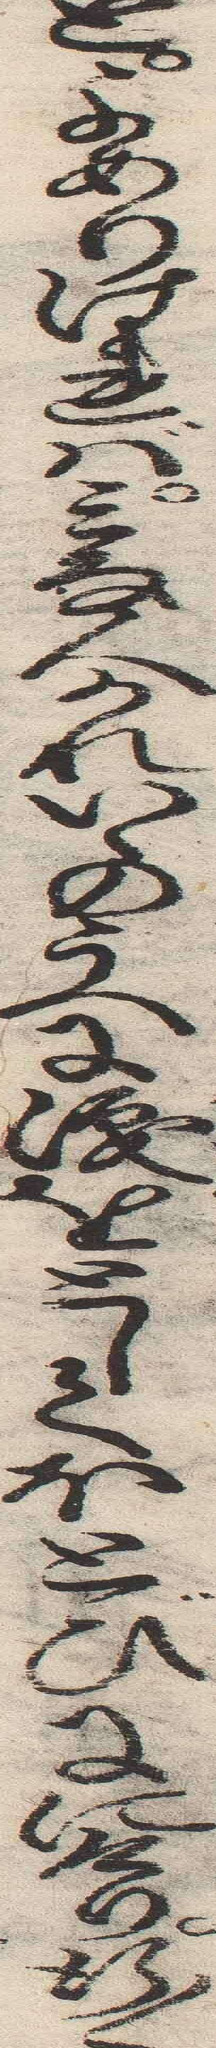と。よめりければ。みな人かれいゝのうへに涙をとしてほとびにけり。行〳〵
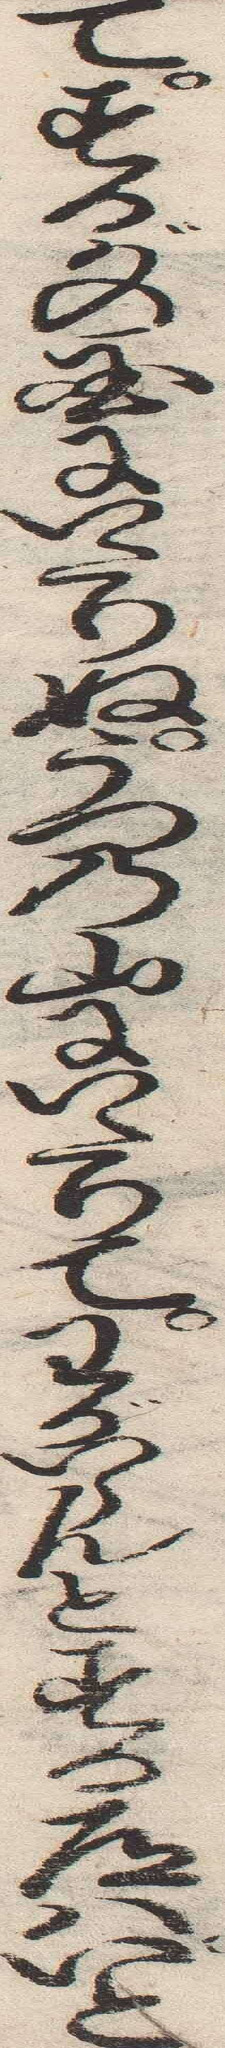て。するがの国にいたりぬ。うつの山にいたりて。わがいらんとする道は。いと
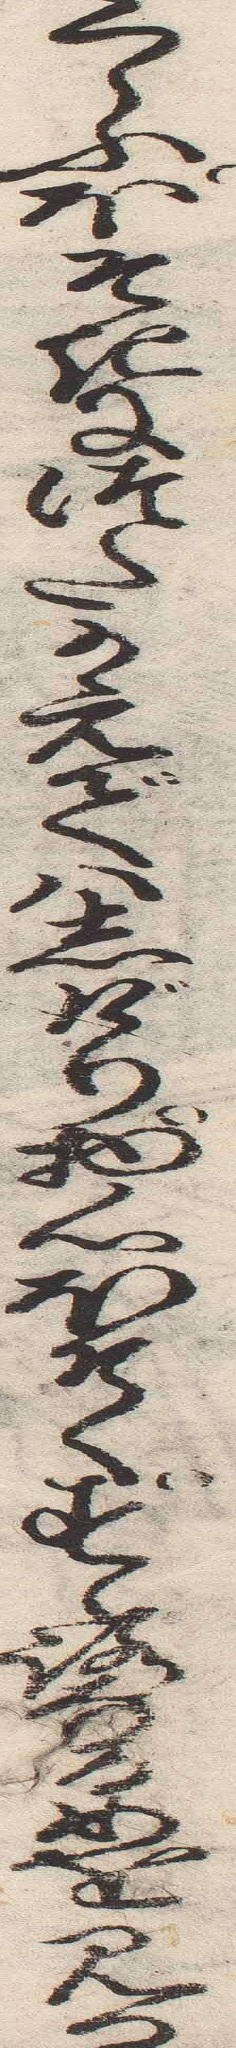くらふ。ほそきにつたかえではしげり。物心ほそく。すゝろなるめを見る
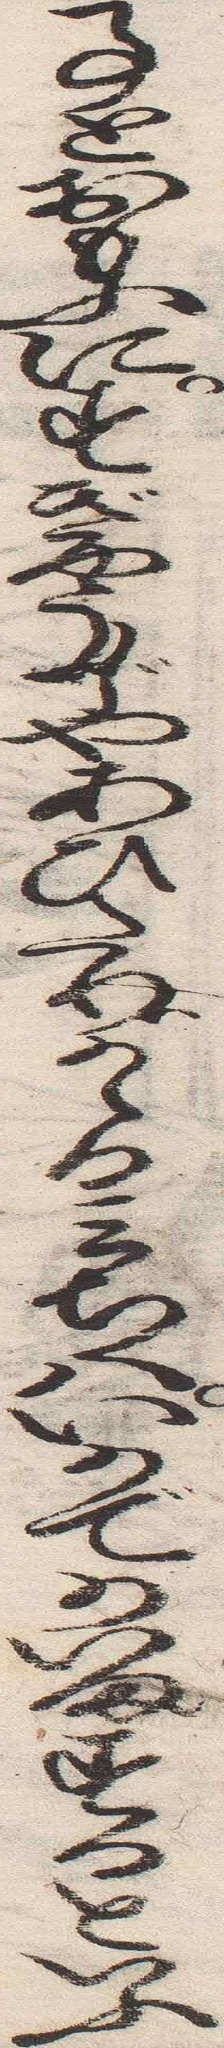事とおもふに。すぎやうじやあひたり。かゝるみちは。いかでかいまするといふ
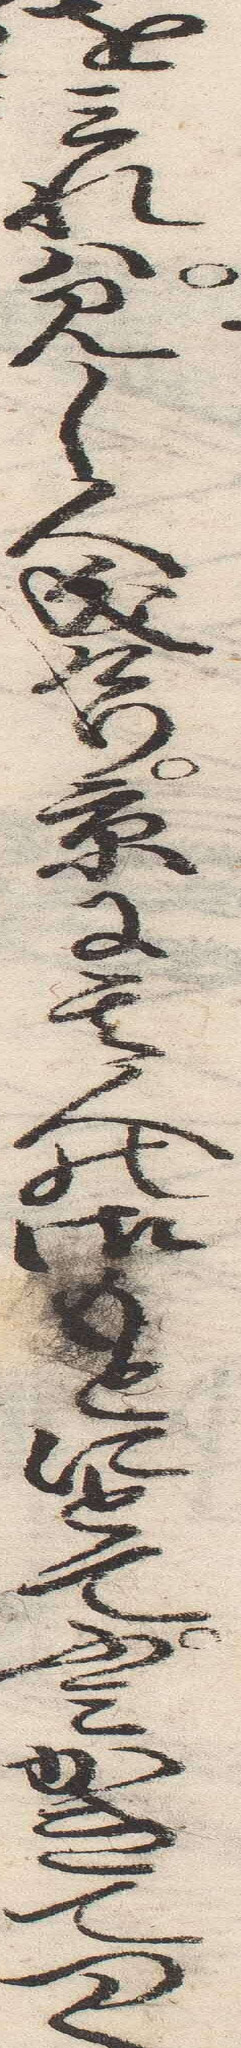をみれは。見し人成けり。京に其人の御もとにとて。ふみかきてつく
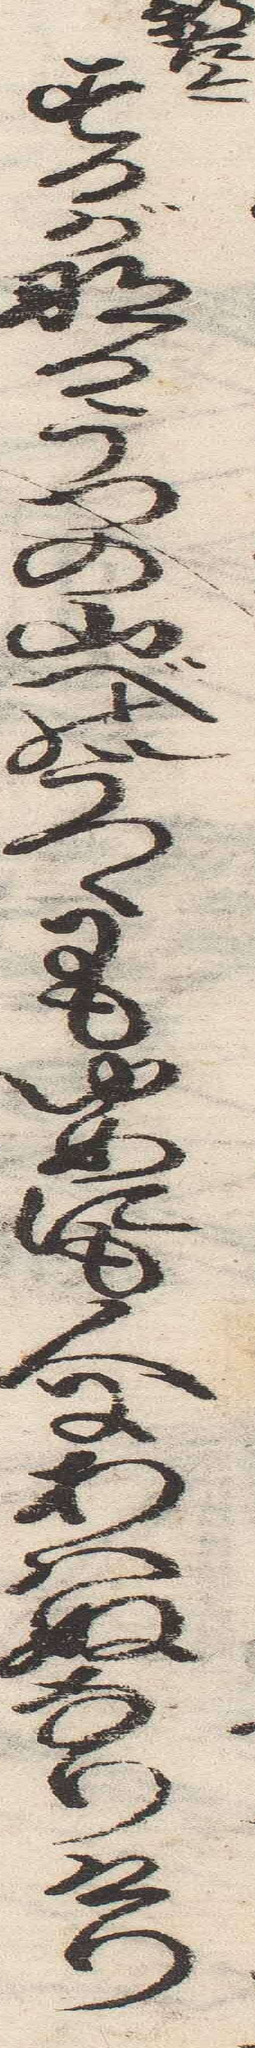新古今するがなるうつの山べのうつゝにもゆめにも人にあはぬなりけり
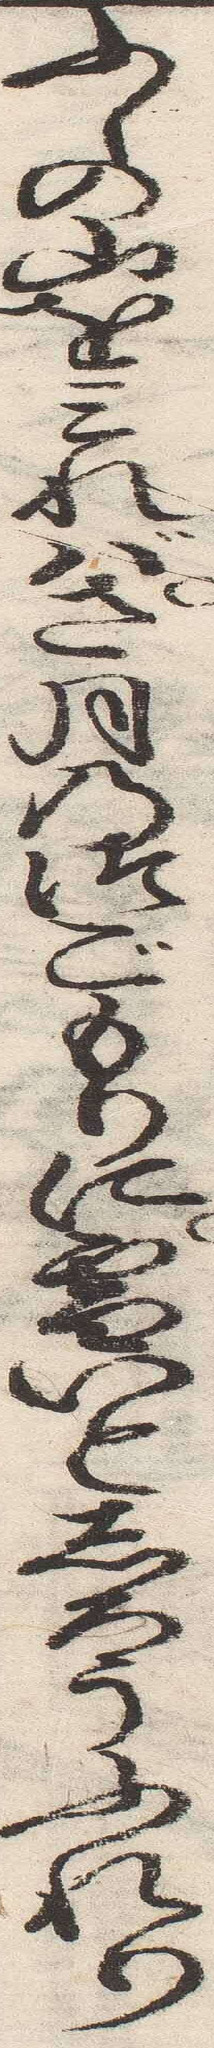ふしの山をみれば。さ月のつごもりに。雪いとしろうふれり
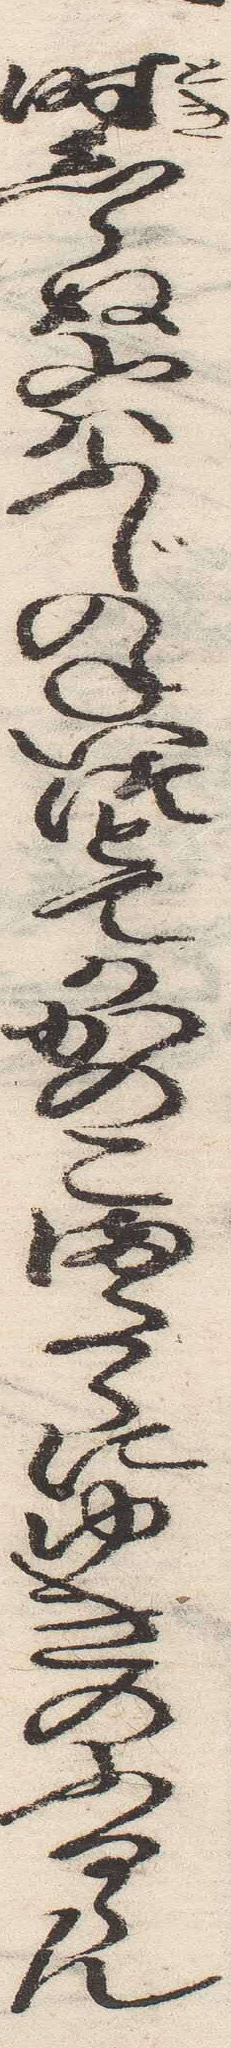同時しらぬ山はふじのねいつとてかかのこまたらにゆきのふるらん
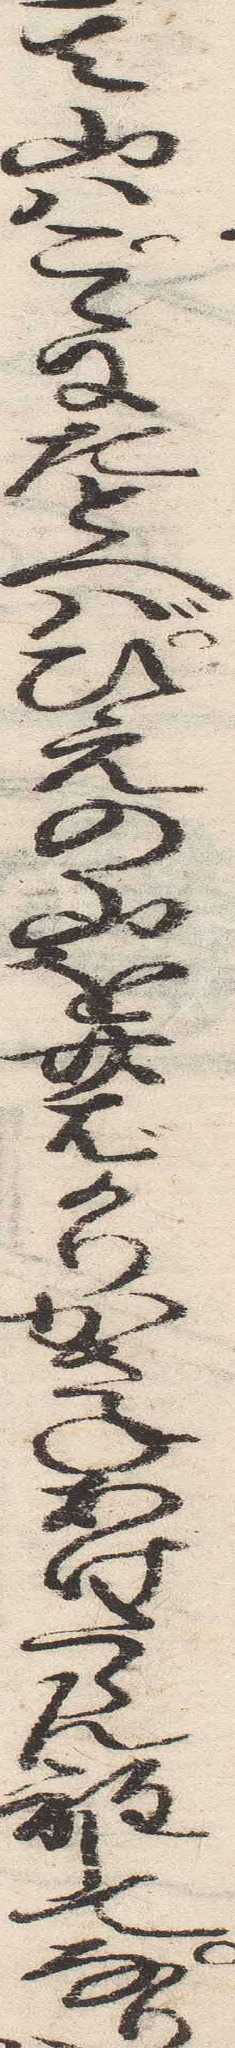其山は。こゝにたとへば。ひえの山を廿ばかりかさねあけたらん程して。なりは
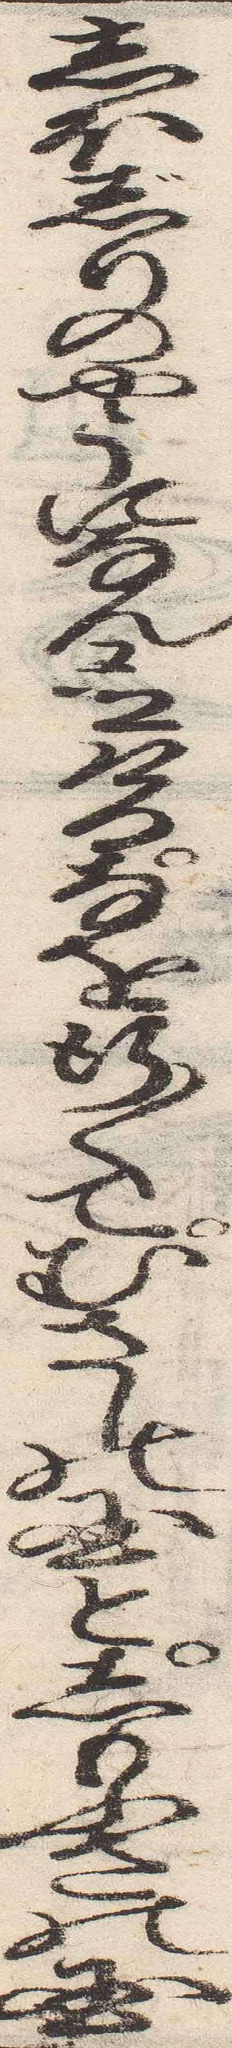しほじりのやうになん有ける。なを行〳〵て。むさしの国と。しもふさの国
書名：伊勢物語
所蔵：東京学芸大学附属図書館 国文学研究資料館
